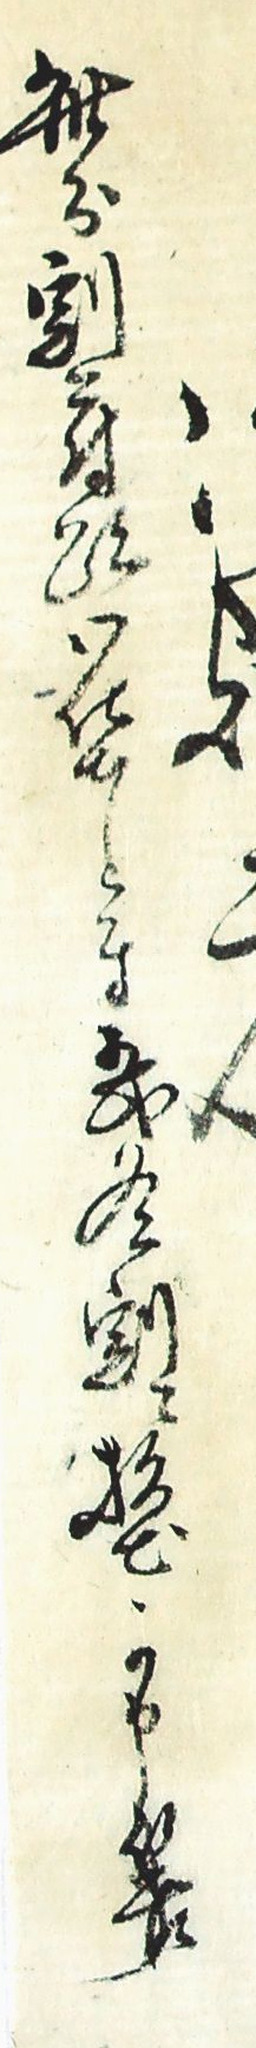此分割苻御仕出しに付当冬割に指出可申筈

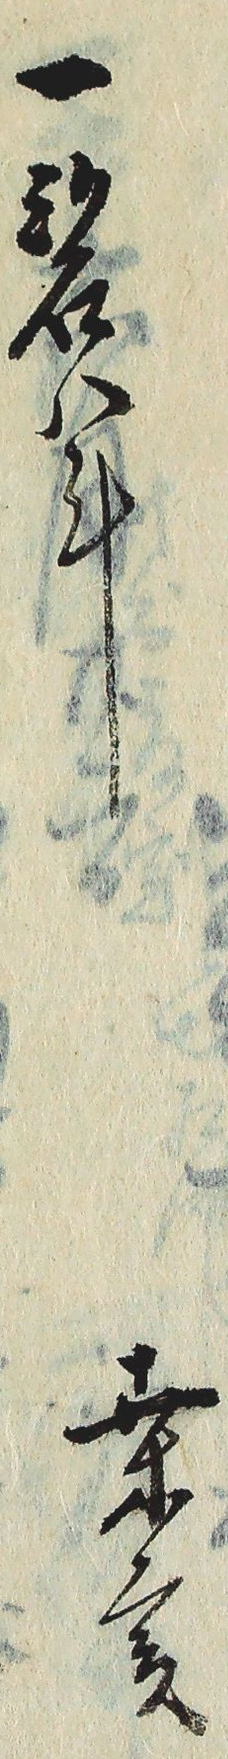一弐石八斗桑実
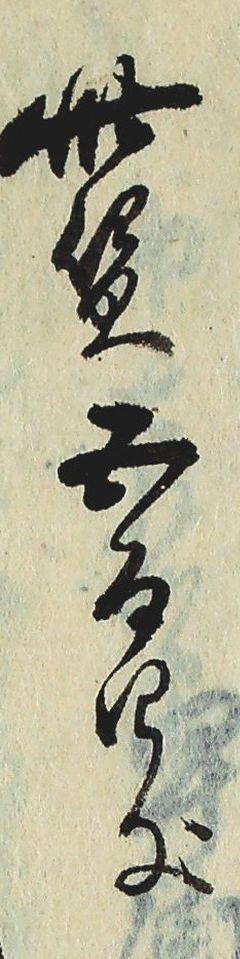此賃五百四匁
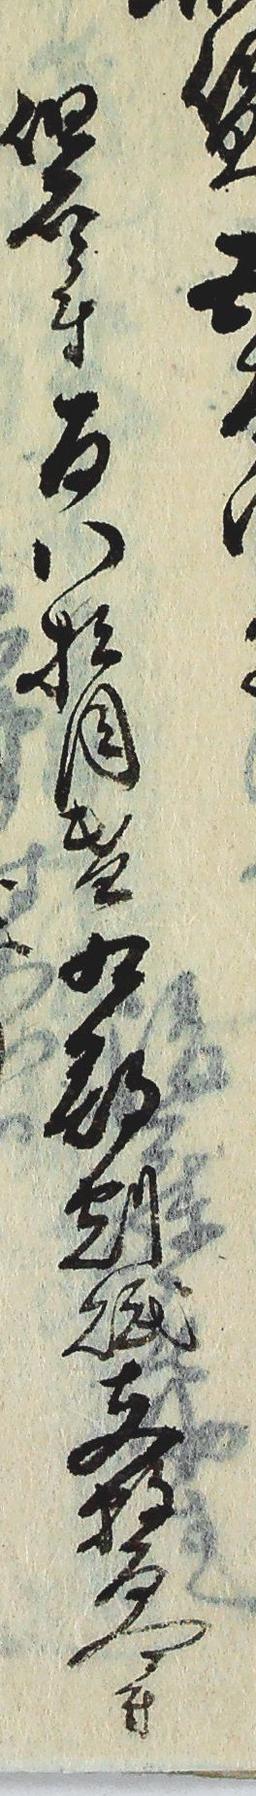但石に付百八拾目替九郡割賦夫数百人に付
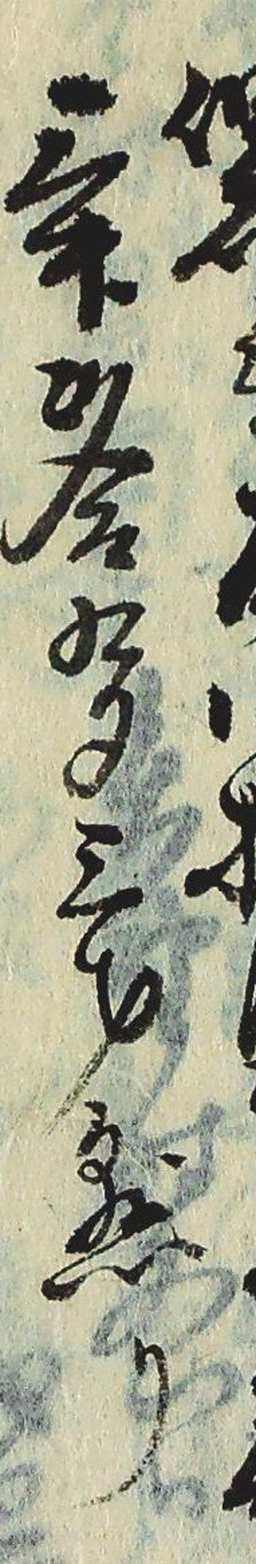三升弐合九勺三才懸り
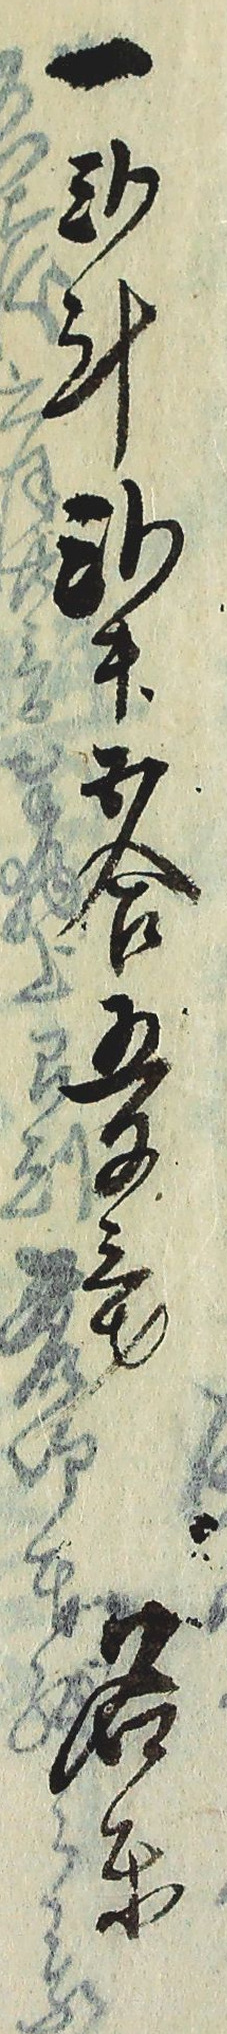一弐斗弐升五合五勺三才名東
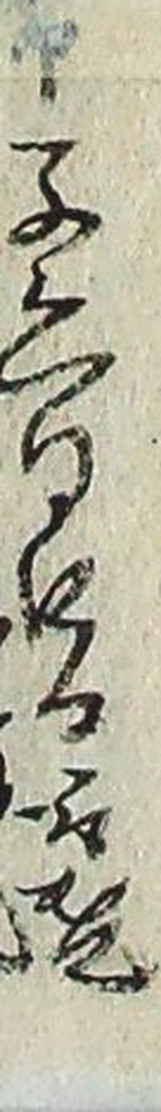子六月四日取替
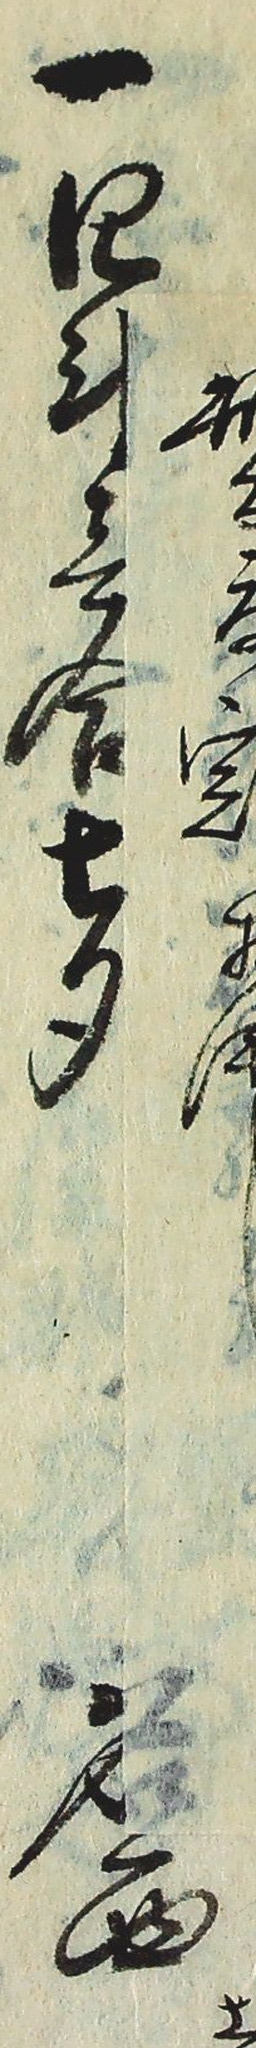一四斗壱合七勺名西
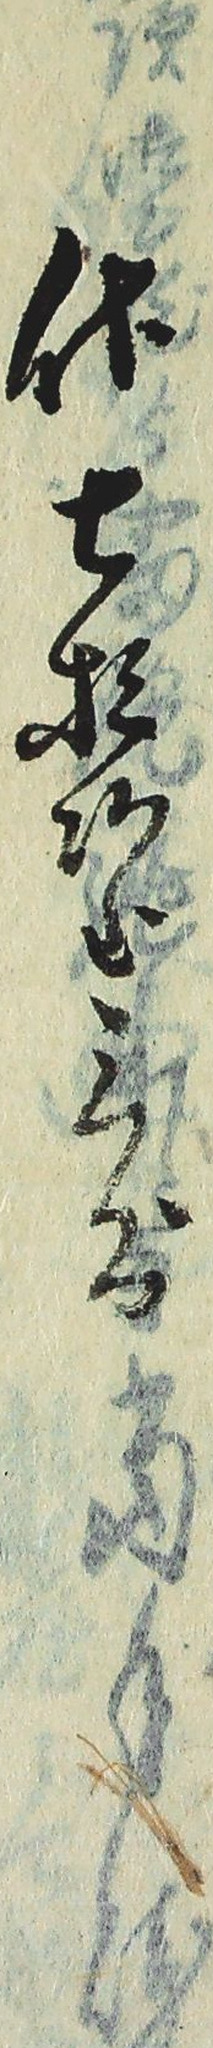代七拾弐匁三分
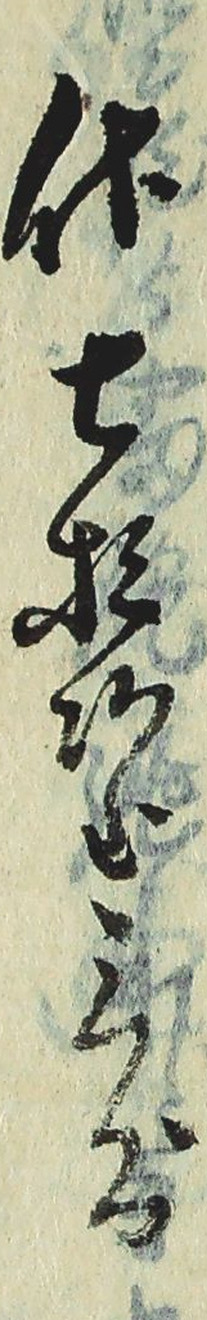代七拾弐匁三分
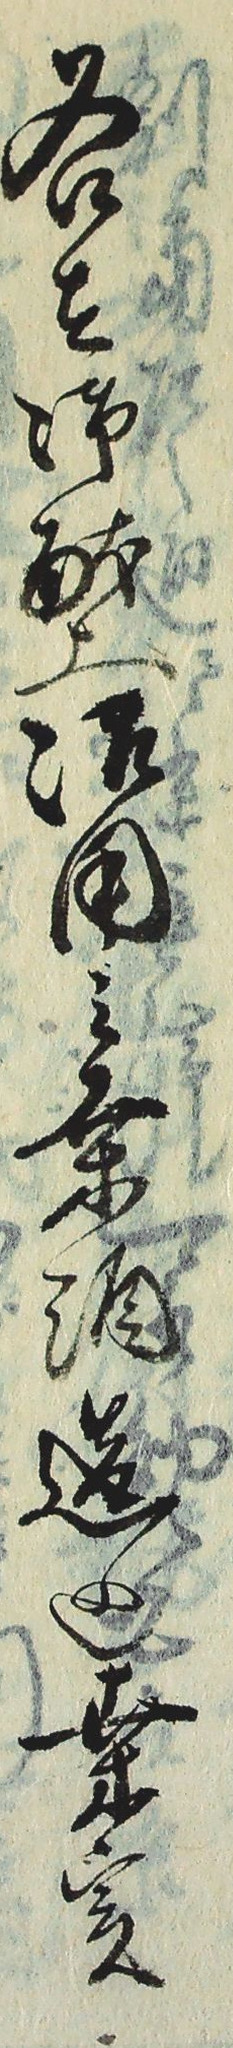右は御献上御用之桑酒造込桑実
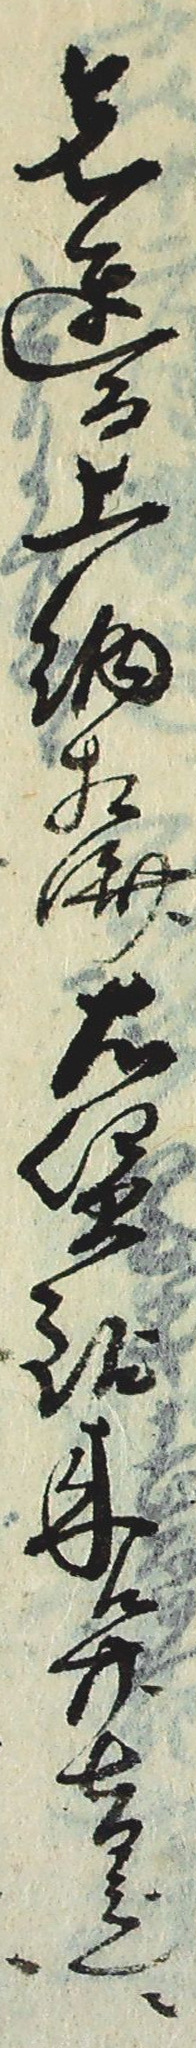先達て上納相済右賃銀来る廿七日迄に
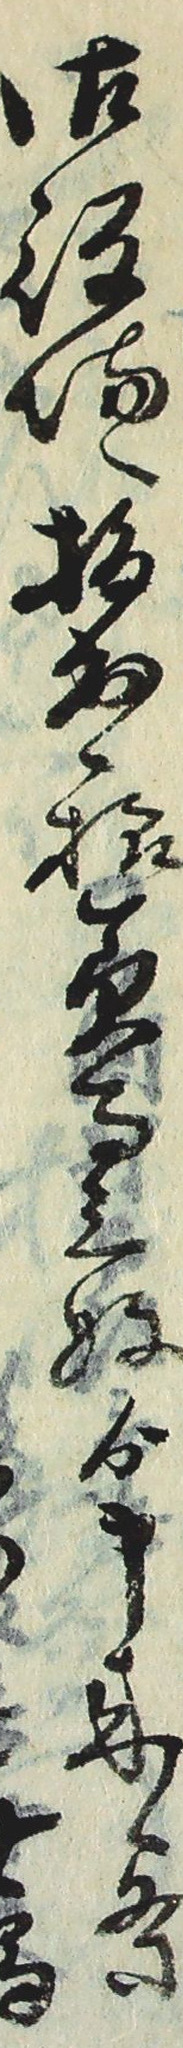御役場へ指出候様美馬三好ゟ申来候条
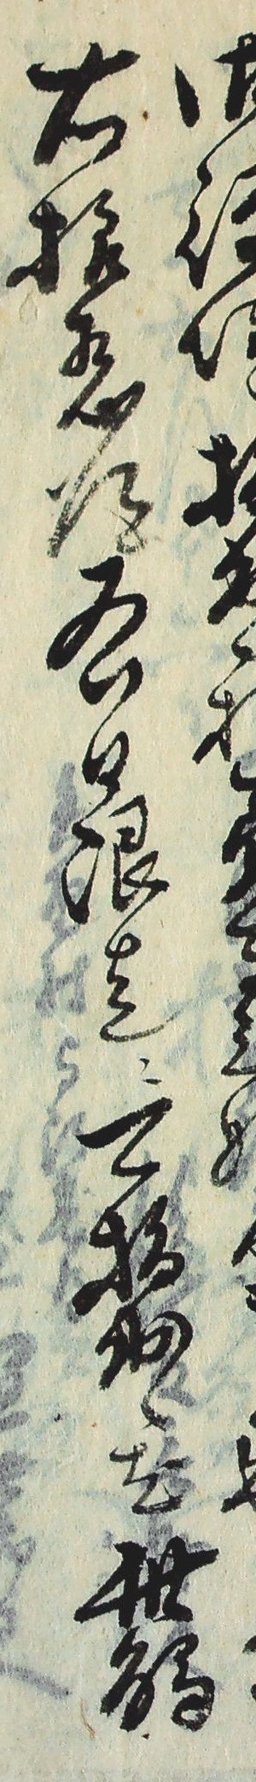右様相心得右日限迄に可指出候尤此触

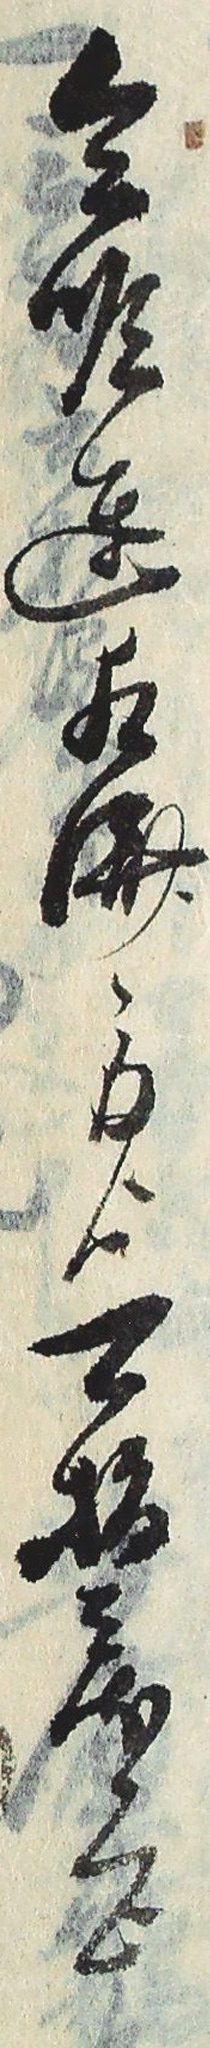令順達相済方ゟ可指戻候以上
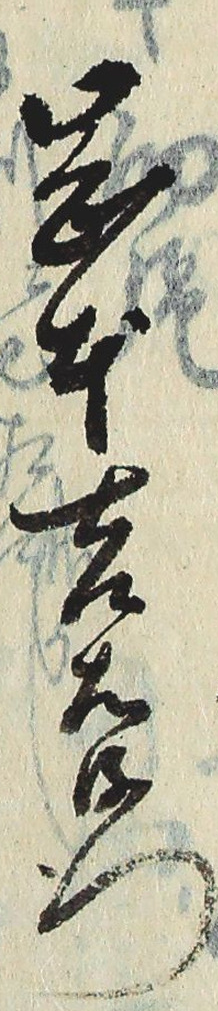岡本吉右衛門
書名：名東郡中諸割賦元帳
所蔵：鳴門教育大学 Naruto University of Education
